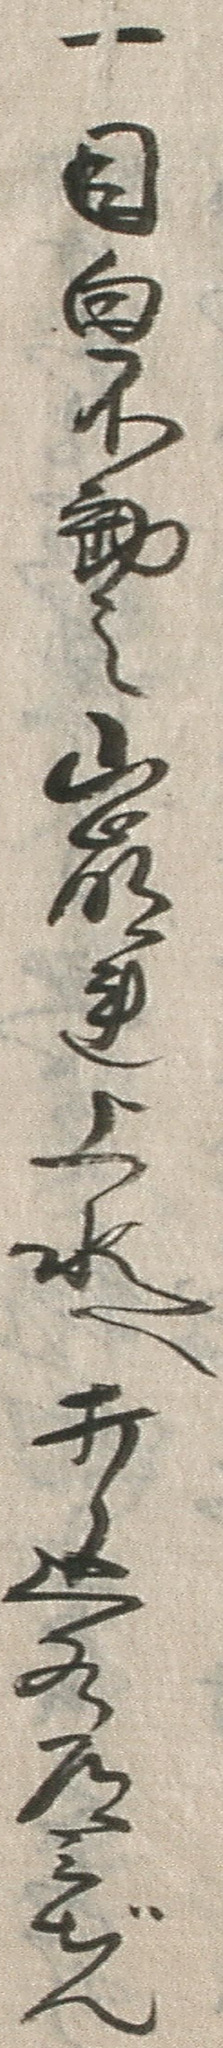一目白不動之山崩れ上水へ打込水道みぢん
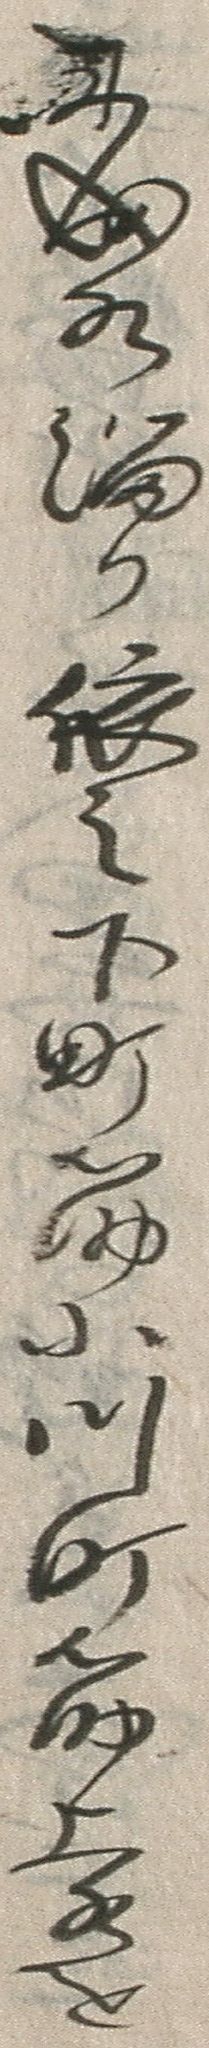に成水溜り依之下町筋小川町筋上水を
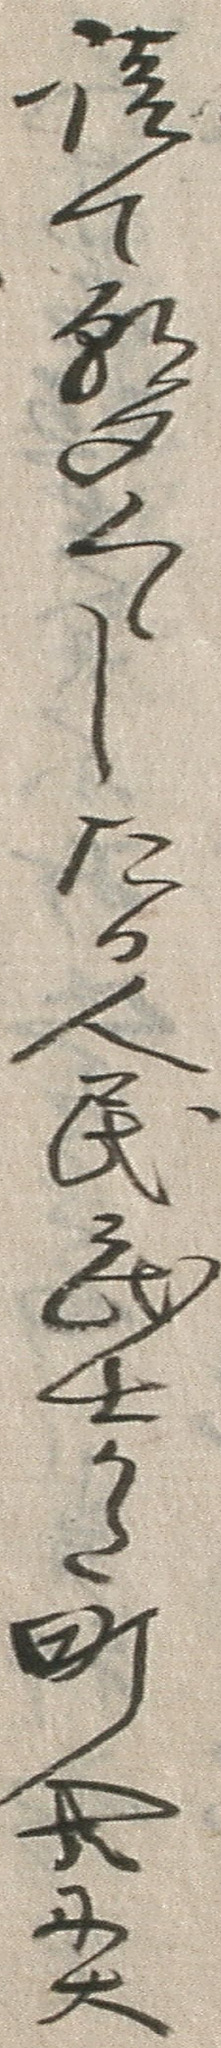請て朝夕くらしたる人民武士かた町人共に大
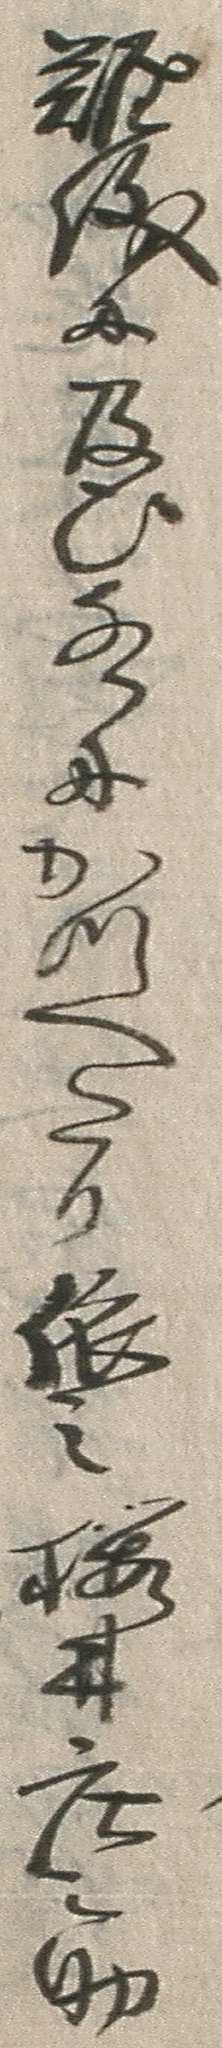難義に及ひ水にかつへたり依之桜井庄之助
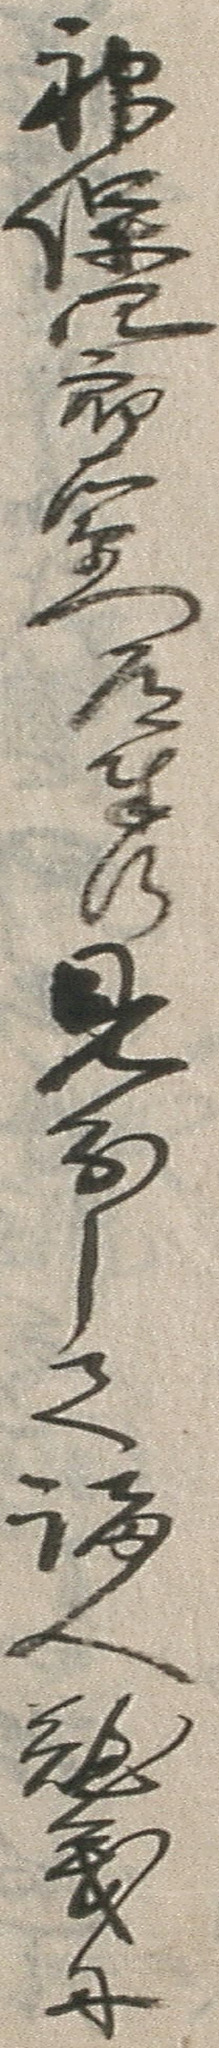神保四郎右衛門道奉行見分して諸人難義に
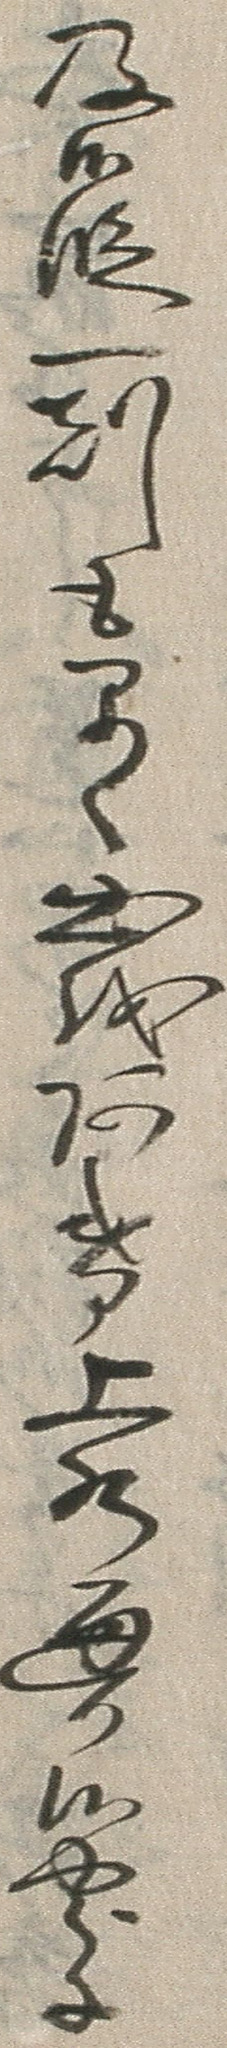及候段一刻も早く土をあけ上水通り候やうに
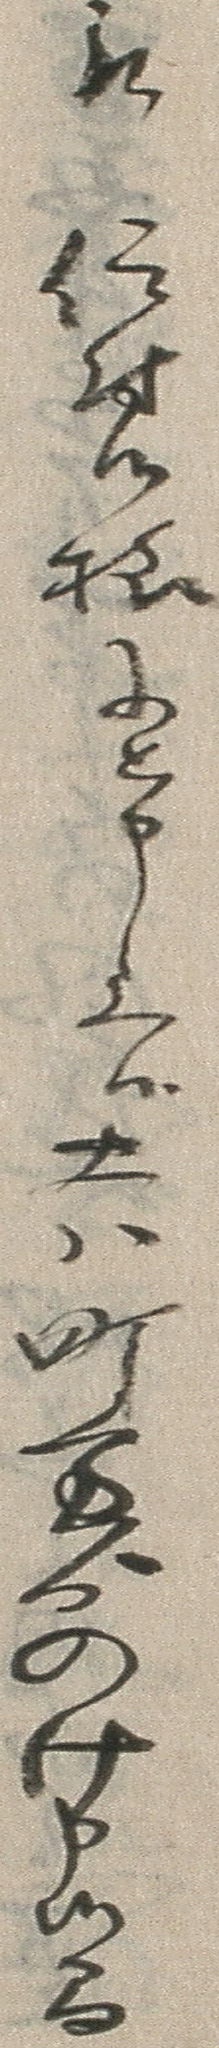被仰付候様にと申上候土は町方ゟのけ申候間
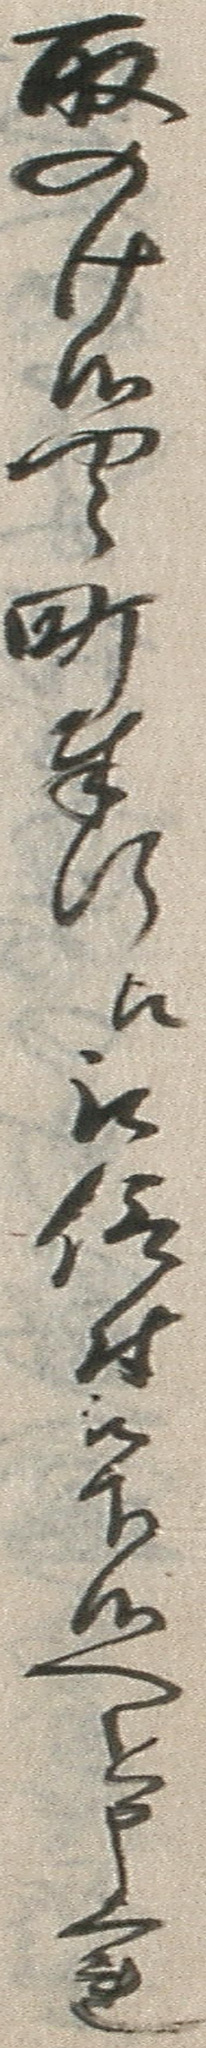取のけ候やう町奉行え被仰付被下候へと申上れ
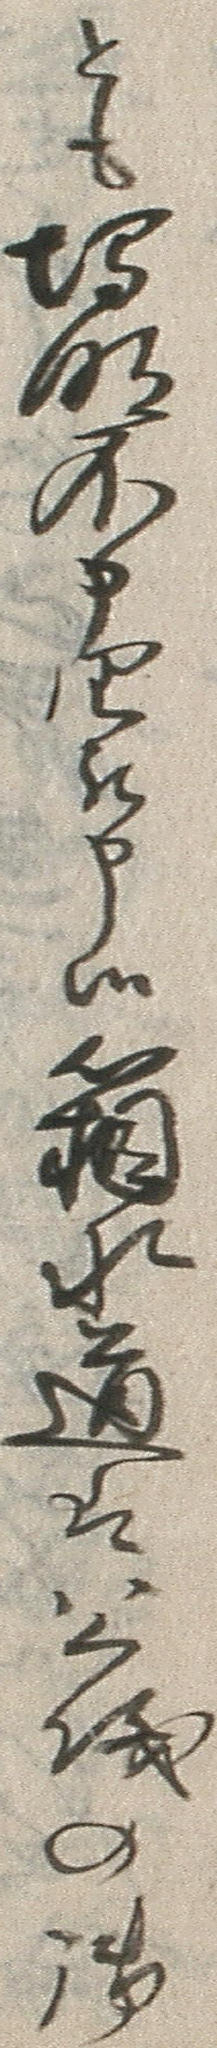とも埒明不申由被申候箱水道は公儀の御
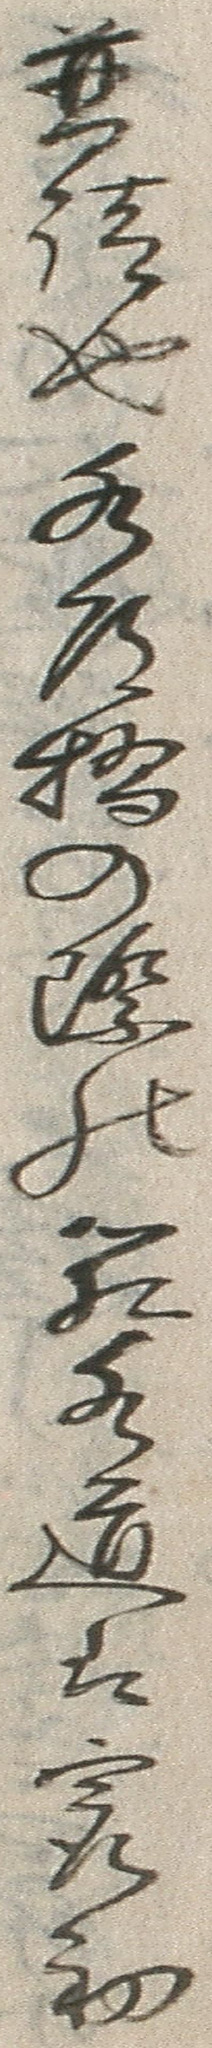普請也水道橋の際の箱水道は最初
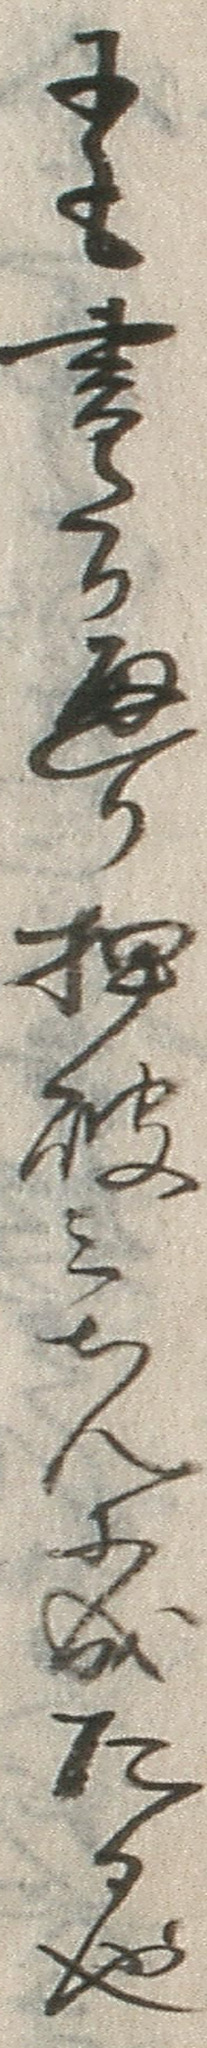にも書たり通り押破みちんに成たる也
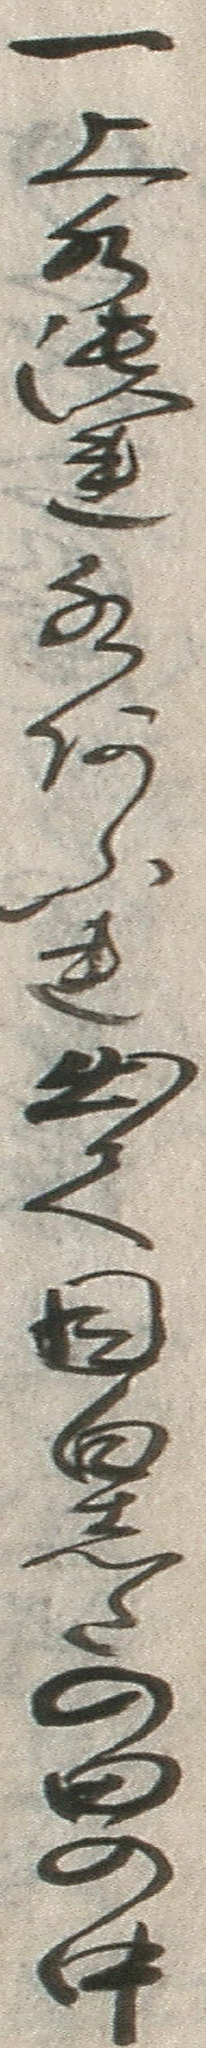一上水潰れ水あふれ出て目白したの田の中
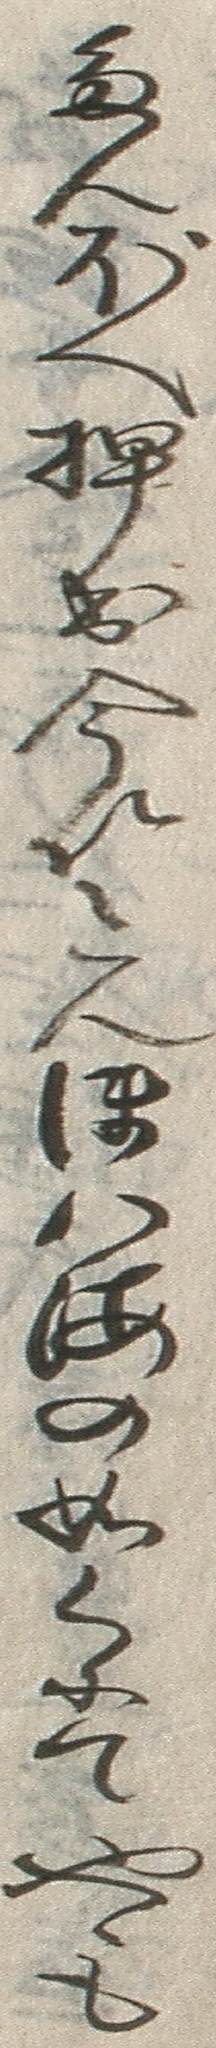たんぼへ押出今以たんほは海の如くにてやゝも
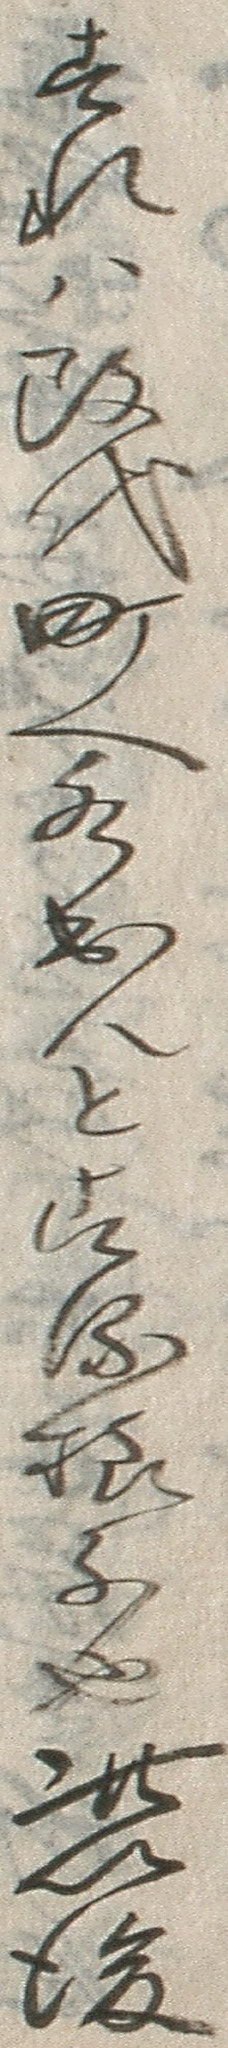すれは改代町へ水出んとする様子也此以後
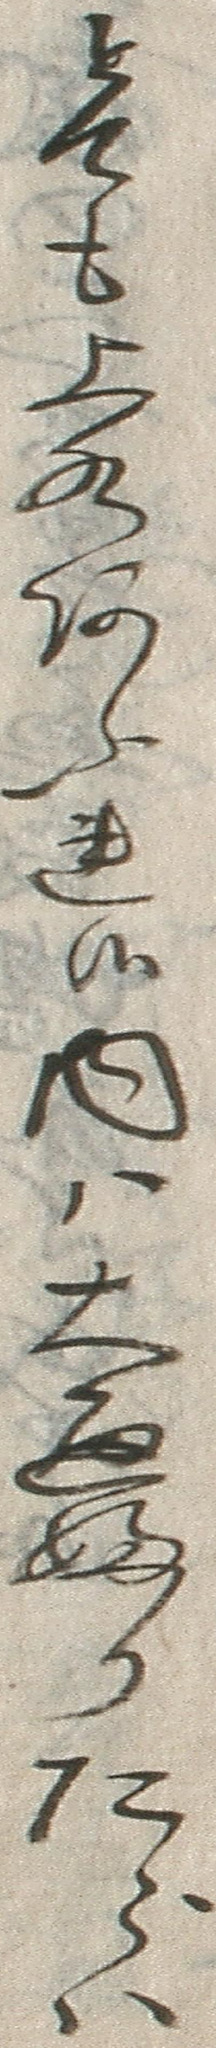とても上水あふれ候内は大通ふりたらは
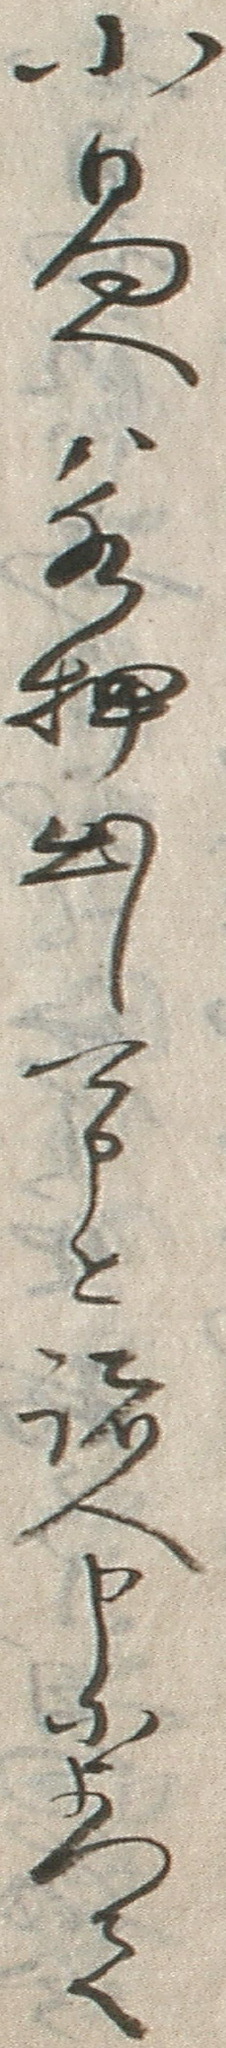小日向へは水押出し可申と諸人申によつて
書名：享保十三年江戸洪水記
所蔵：東京大学地震研究所図書室 Earthquake Research Institute Library, The University of Tokyo, JAPAN
